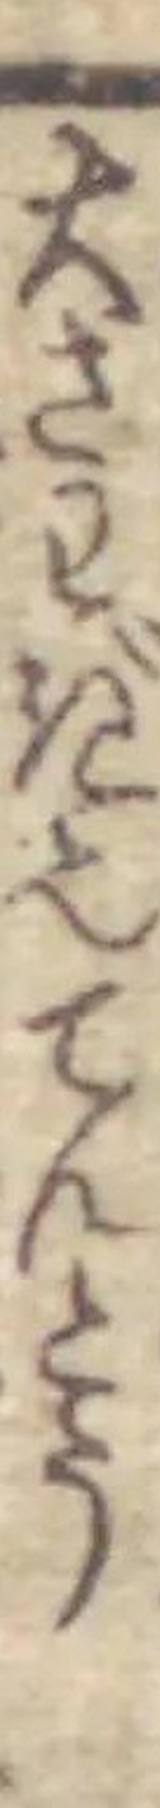大さわぎ也てんとう
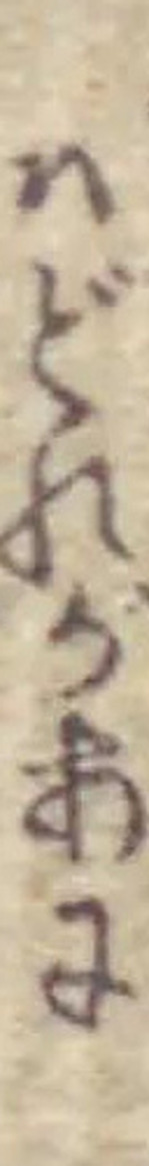はどれがあに
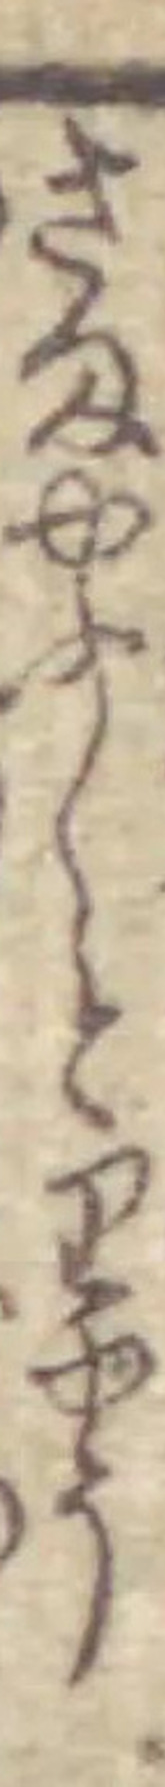さまやふ〳〵とりやう
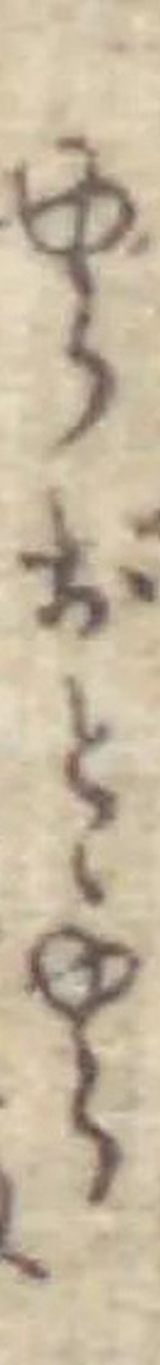やらおとゝやら
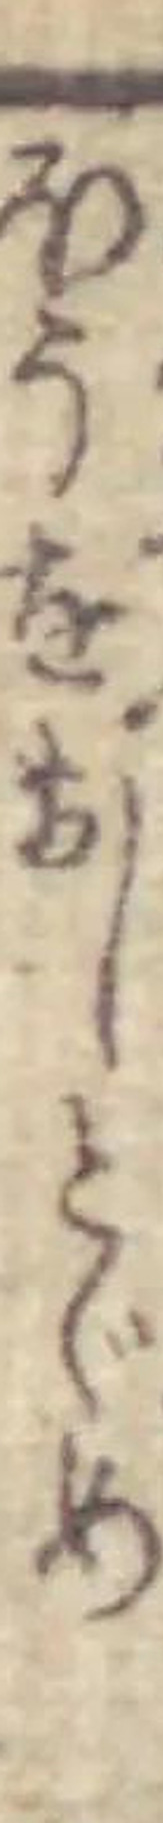ほうをおしとゞめ
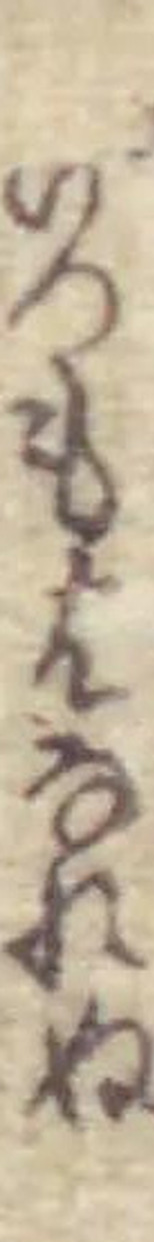いつもはなれぬ
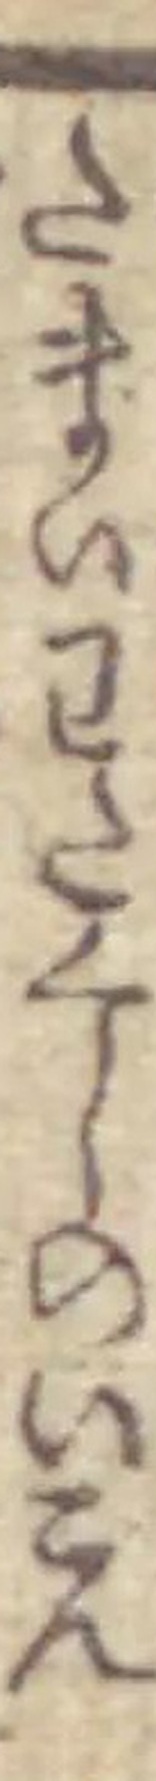たまいわたくしのいこん
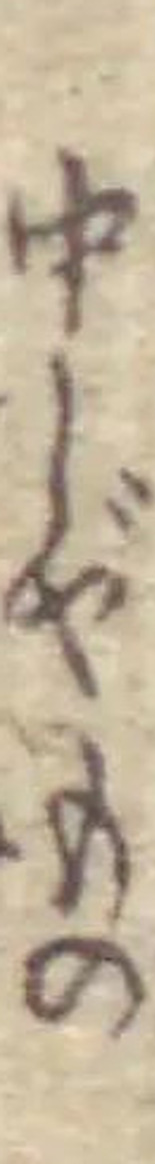中じやもの
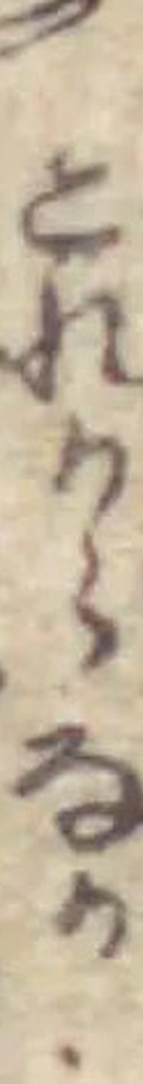これからなか
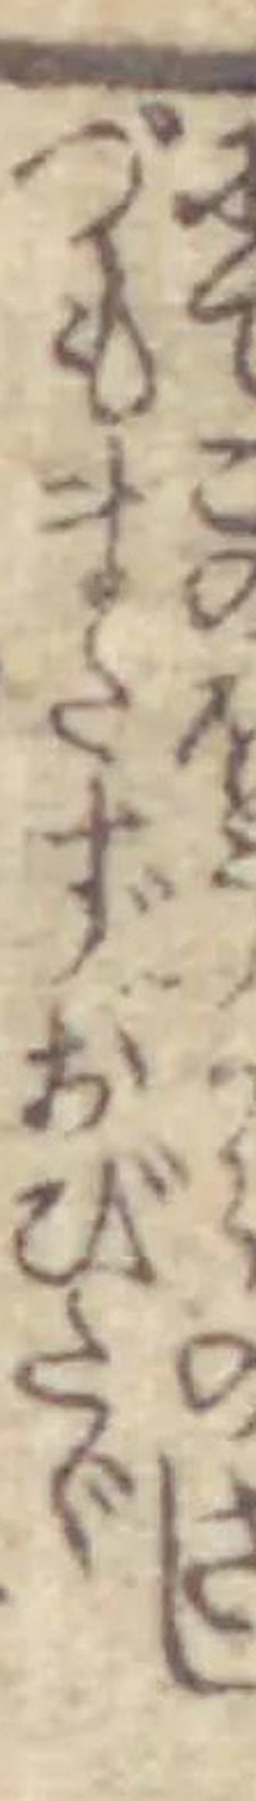づもまたずおびたゞ
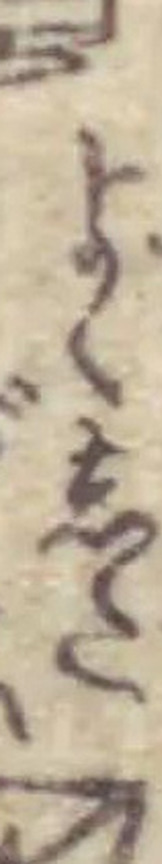よくした
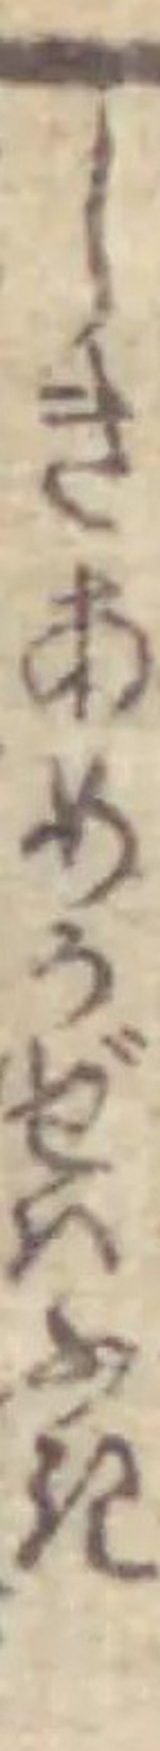しきあめかぜはふき
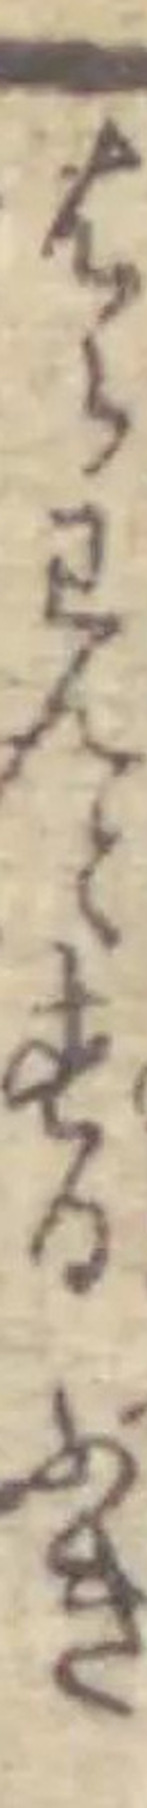はらわんとするふき
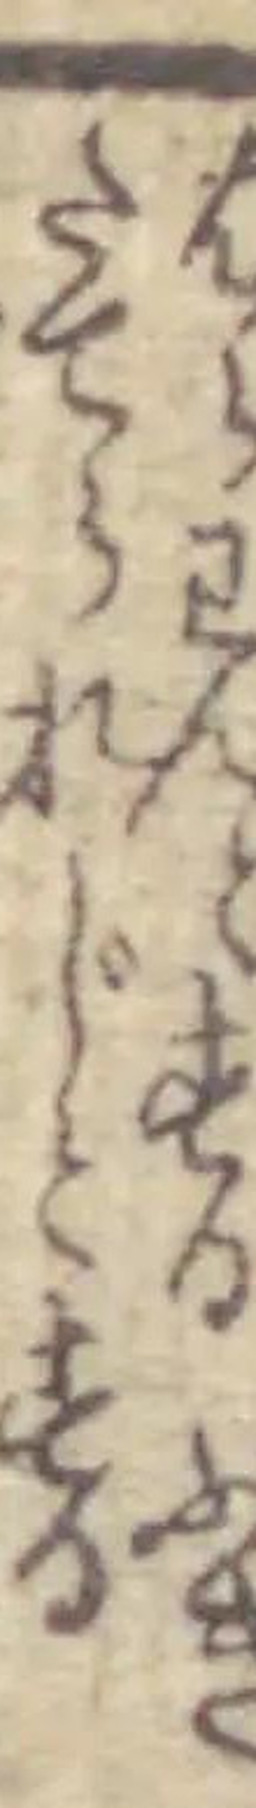たてられじとする
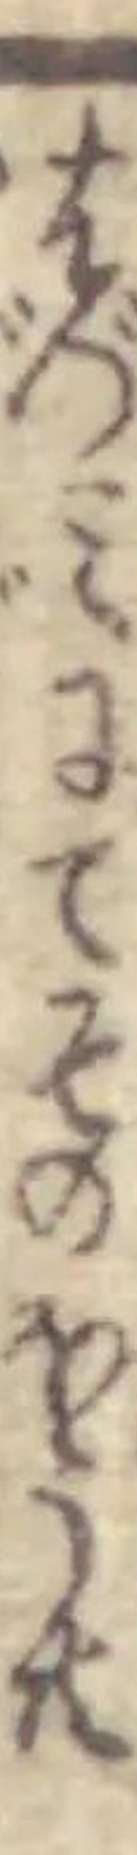はづみにてそのほう共
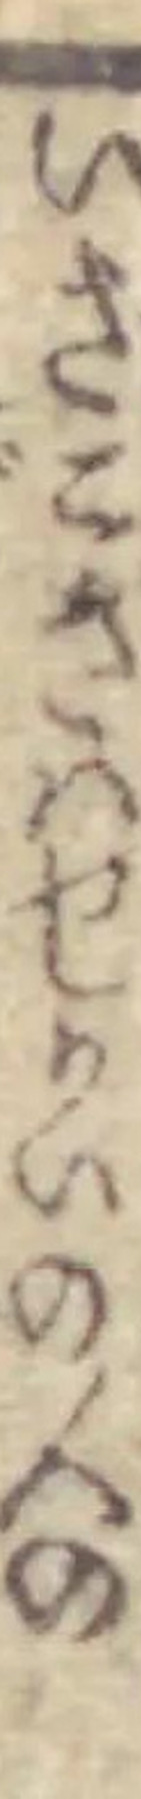いざこざはせかいの人の
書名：雨宮風宮出儘略縁記 3巻
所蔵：国立国会図書館 National Diet Library, JAPAN
